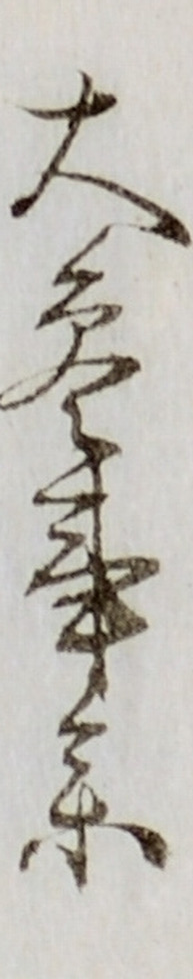大参事参
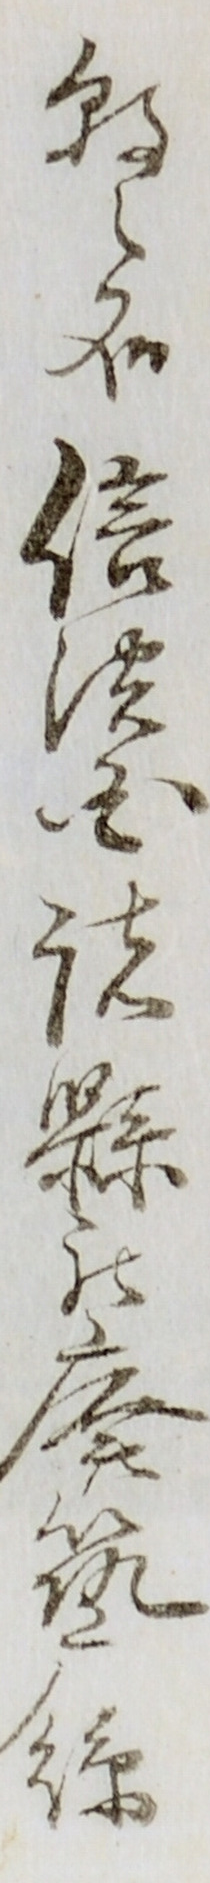朝之処信濃国諸県被廃止筑摩県
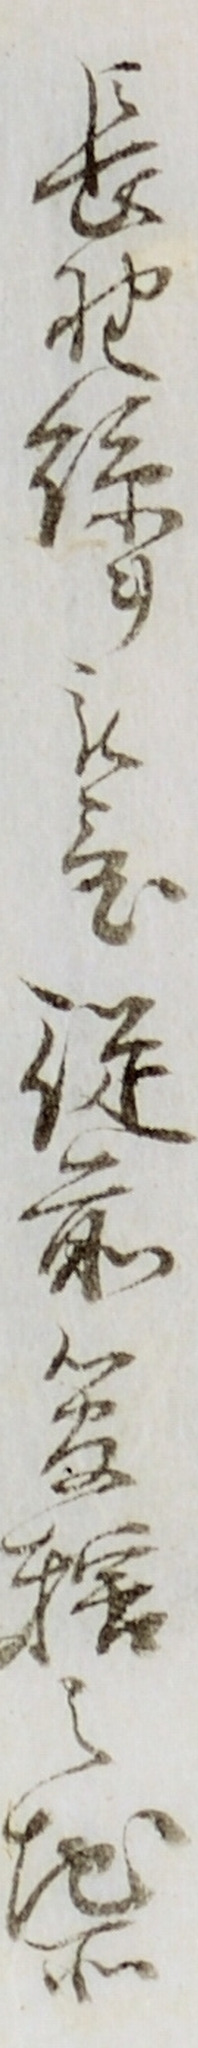長野県ヲ被置従前管轄之地所
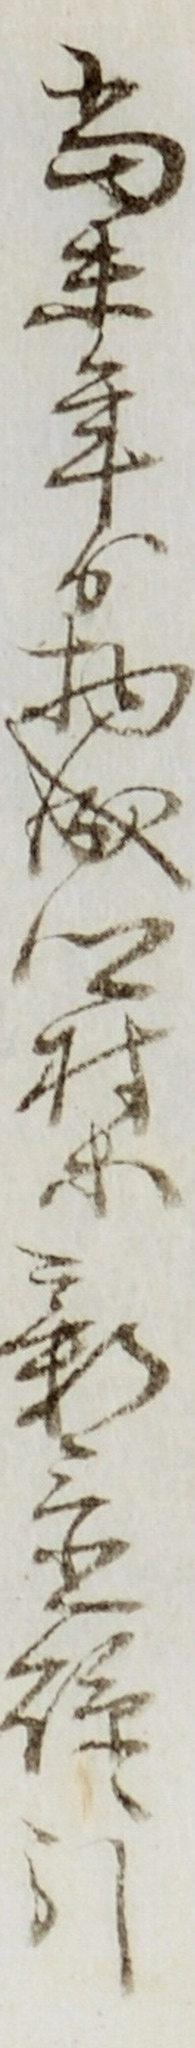当未年ゟ物成郷村等新置県へ引
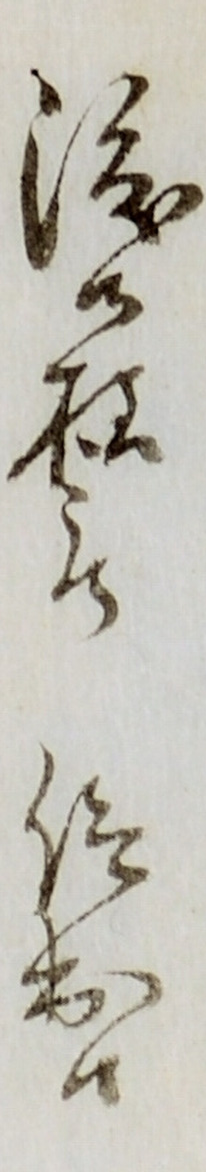渡候様被仰出候
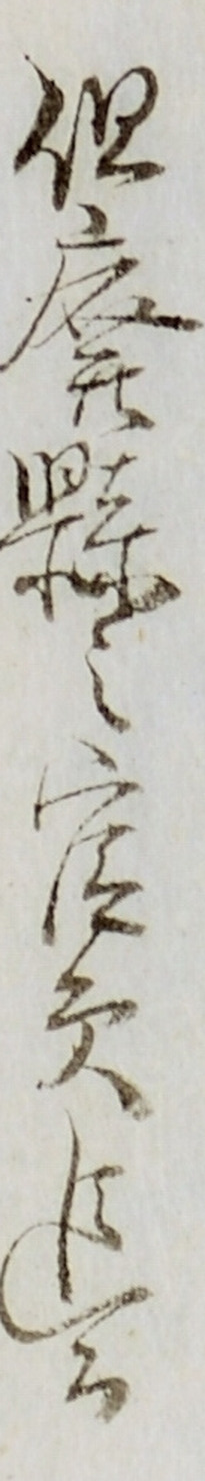但廃県之官員追て
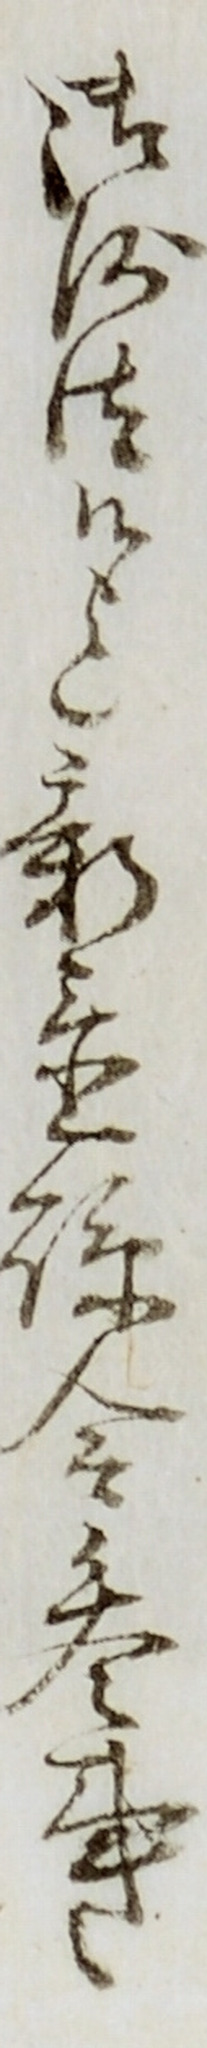御沙汰候迄新置県全参事之
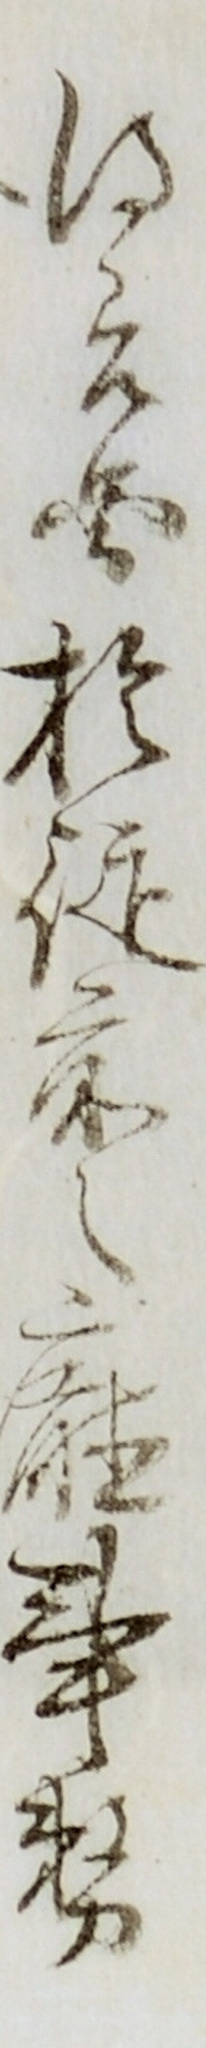得差図於従前之庁事務
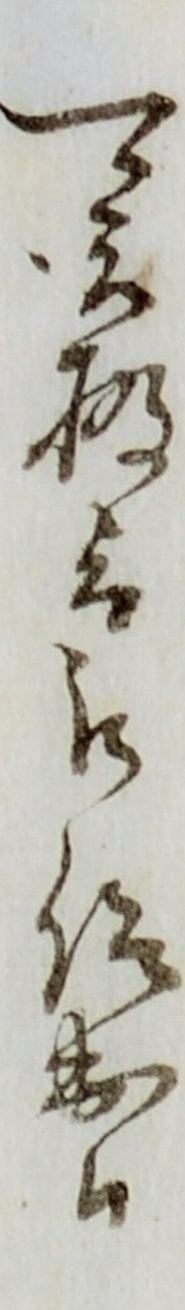可取扱旨被仰出候
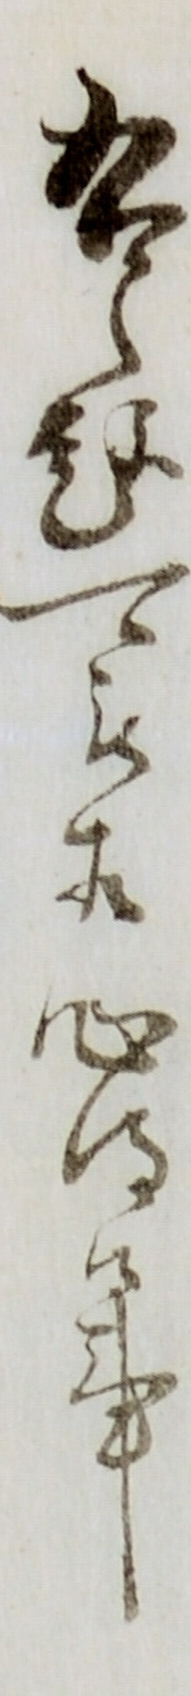右之趣可被相心得候事

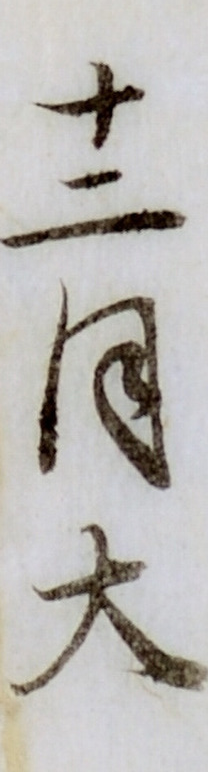十二月大
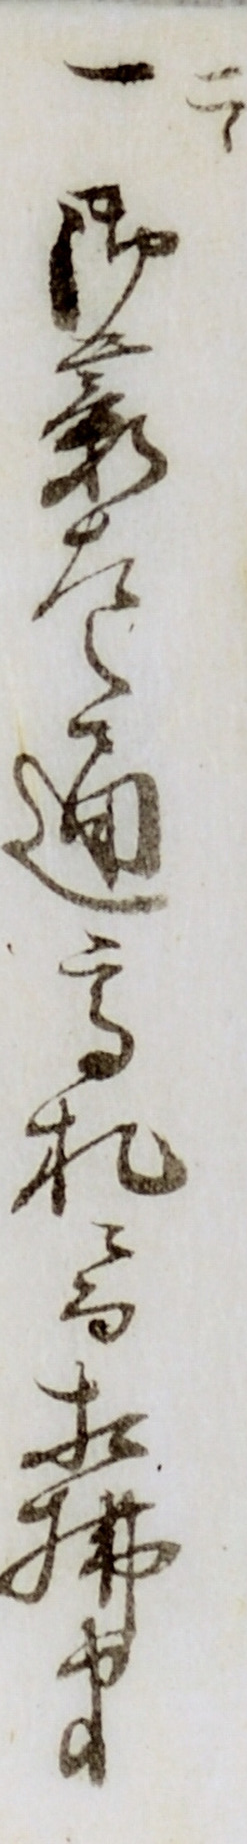一御薪左之通高札にて相払申候
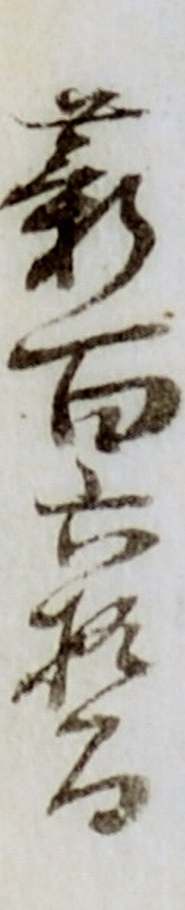薪百六拾間
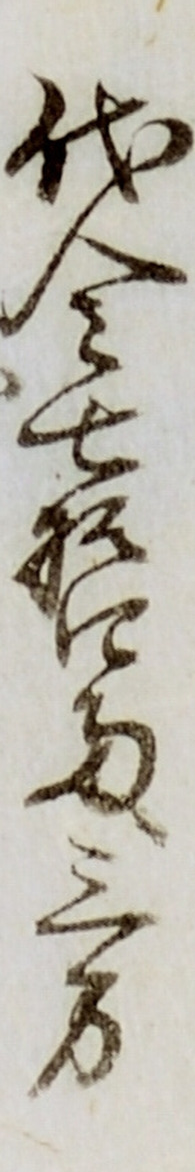代金七拾四両三分
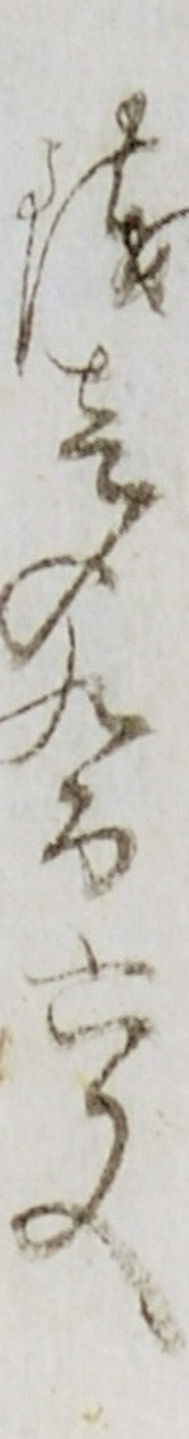銭壱貫九百六文
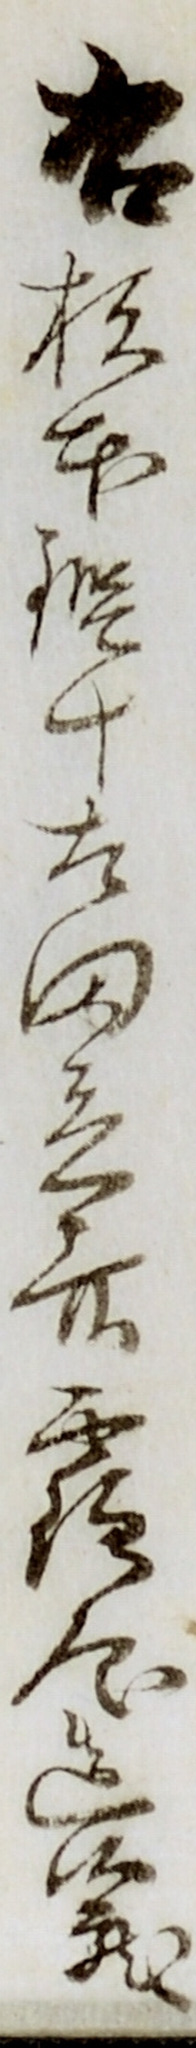右杉本鑑十太田立斎鶴屋造酒蔵へ
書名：山林方諸事御用留
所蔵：伊那市立高遠町図書館・合同会社AMANE
